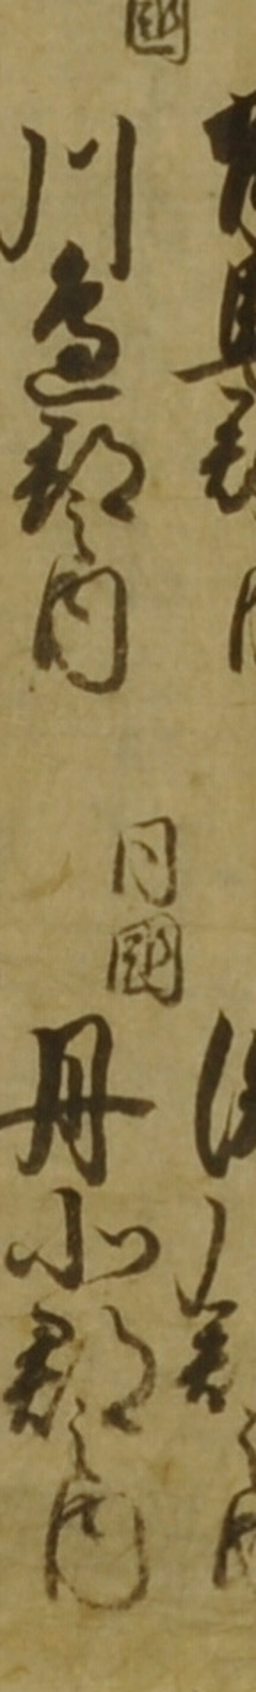川辺郡之内丹北郡之内
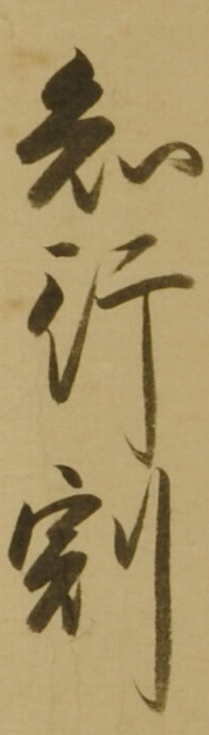知行割

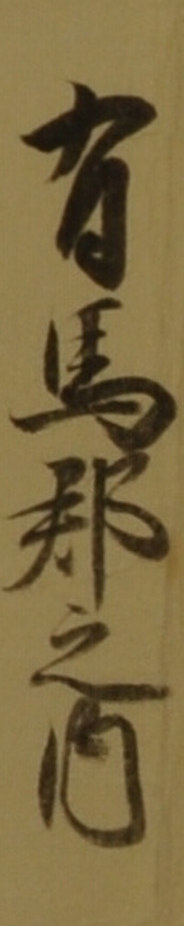川辺郡之内
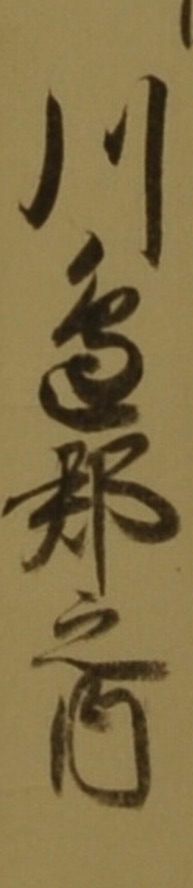川辺郡之内
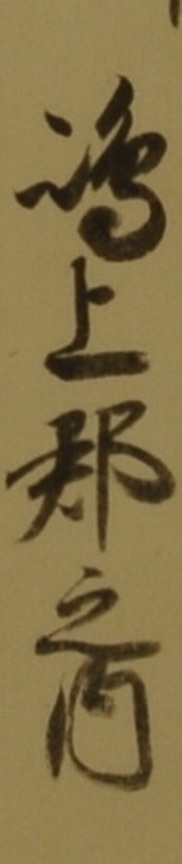島上郡之内
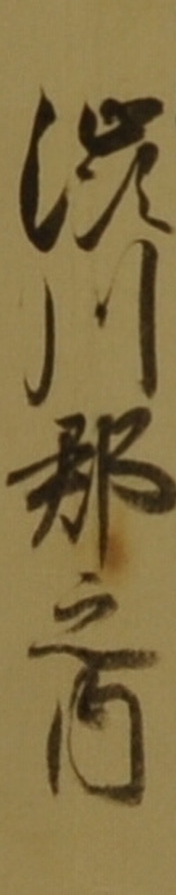渋川郡之内
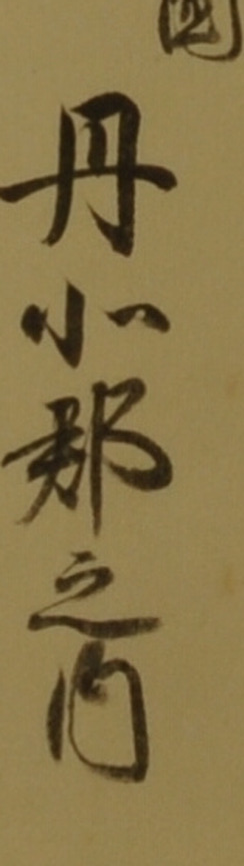丹北郡之内
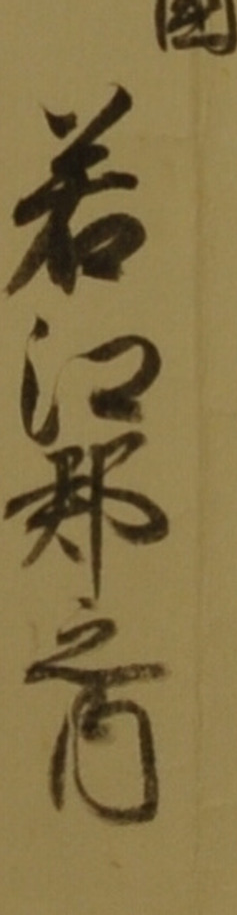若江郡之内
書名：御書出
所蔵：伊那市立高遠町図書館・合同会社AMANE
